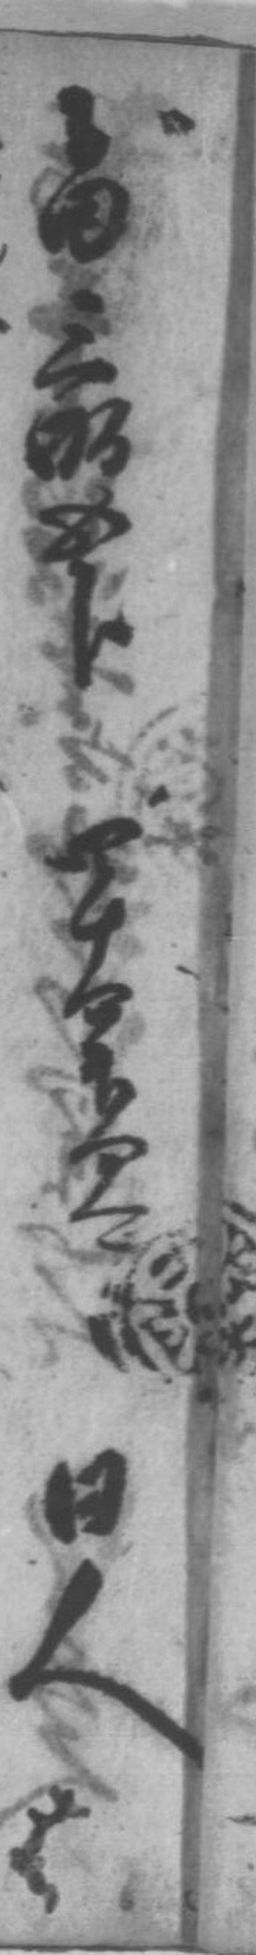下田三畝五分四斗四升四合同人
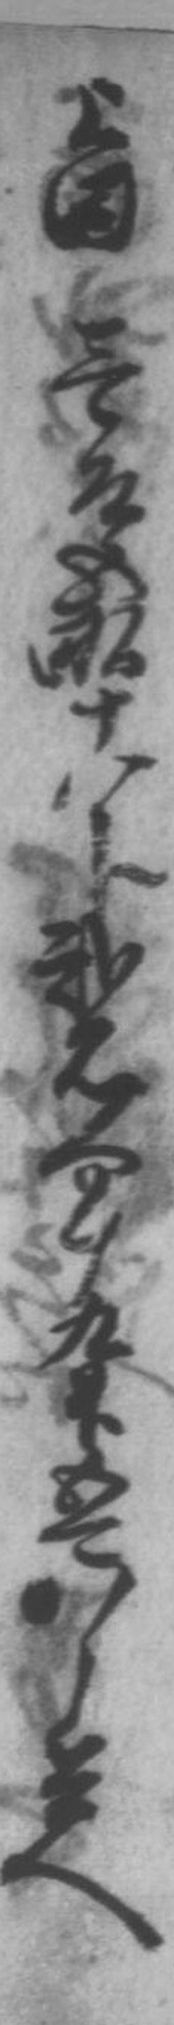上田三反五畝十八分弐石八斗九升五合八郎兵衛
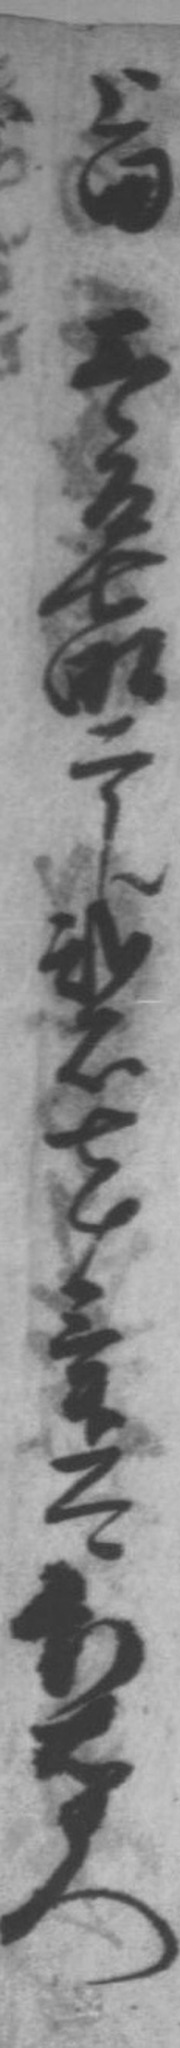上田壱反七畝二分弐石七斗三升一合新右衛門
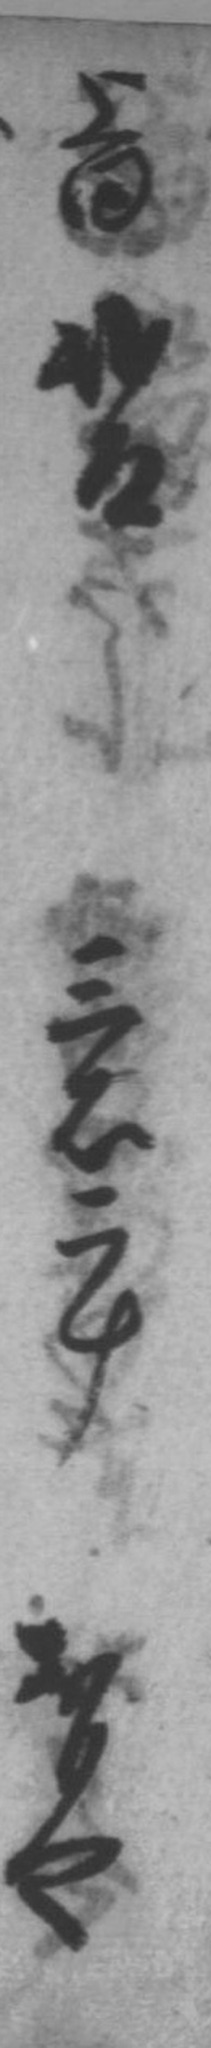上田弐反三石二斗おりや
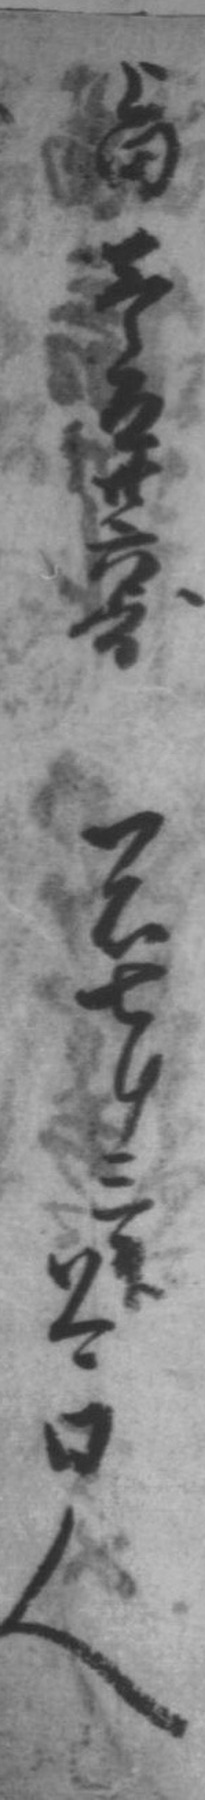上田壱反廿六歩壱石七斗三升八合同人
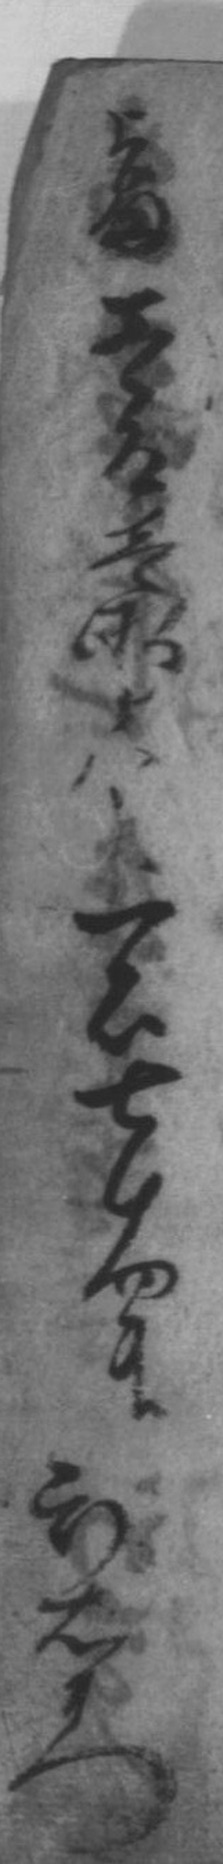上畠壱反一畝十八分一石七斗四升新右衛門

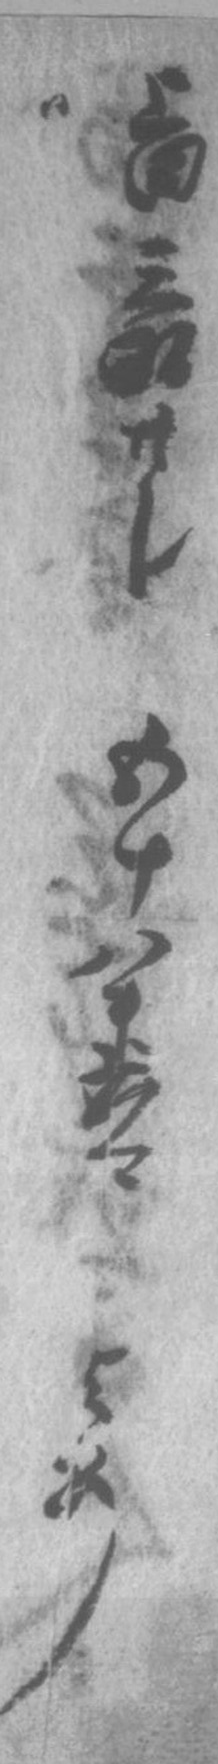上田三畝廿分五斗八升壱合与次郎
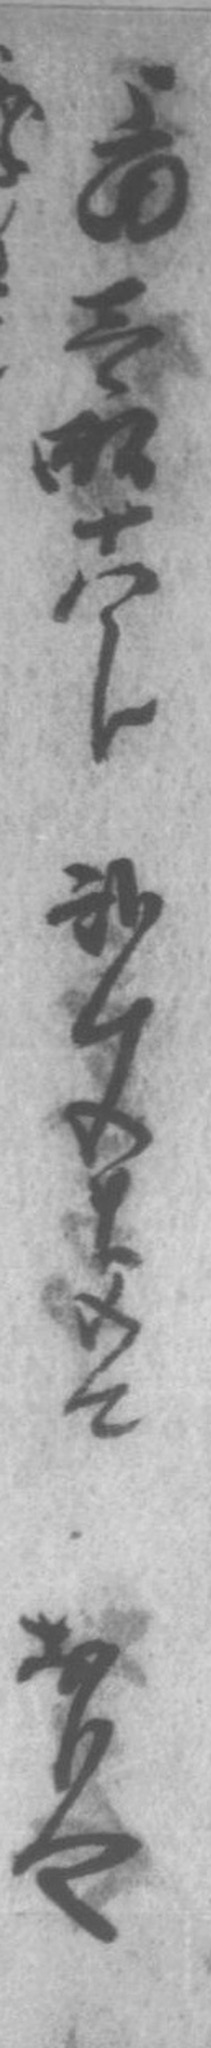上田壱畝十八分弐斗五升五合おりや
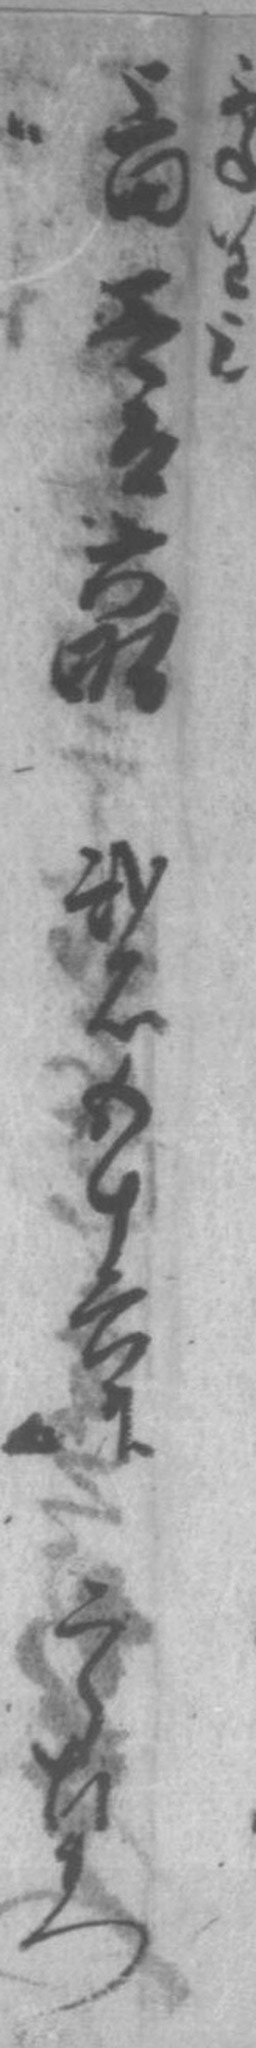上田壱反六畝弐石五斗六升二郎左衛門
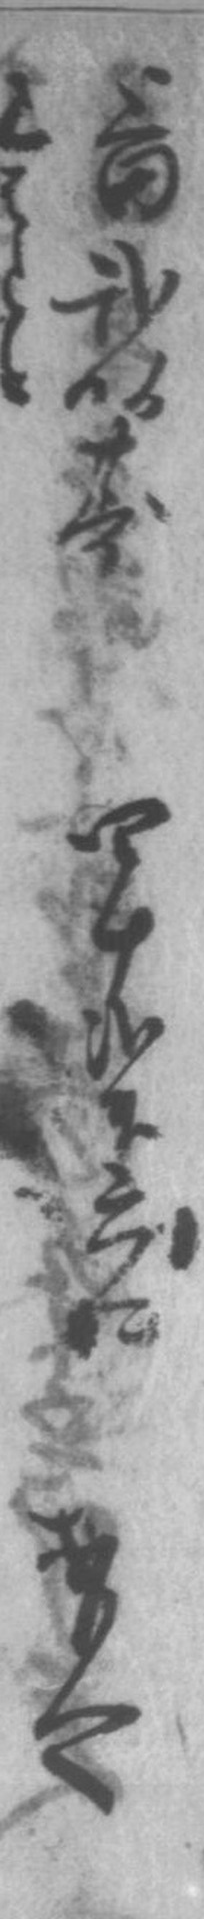上田弐畝廿分四斗弐升六合おりや
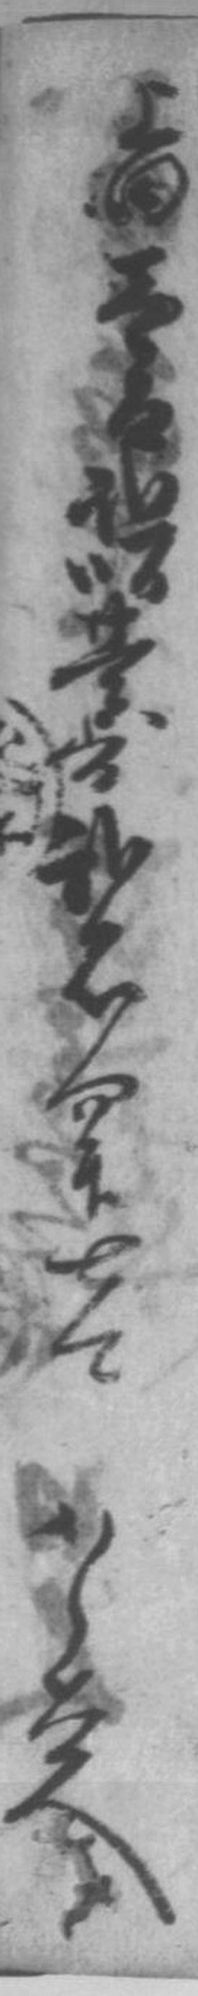上田壱反弐畝廿壱歩弐石四升七合八郎右衛門
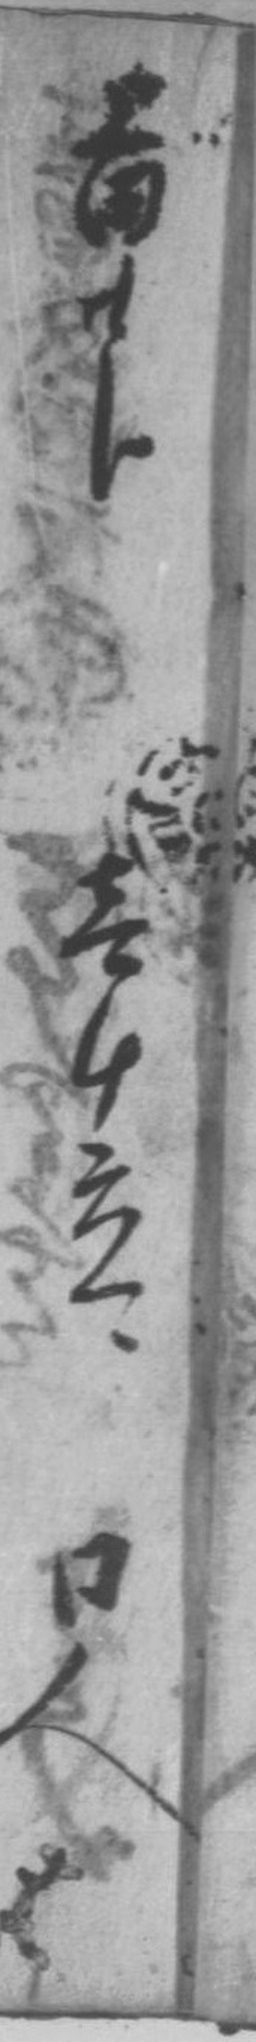上田廿分壱斗六合同人
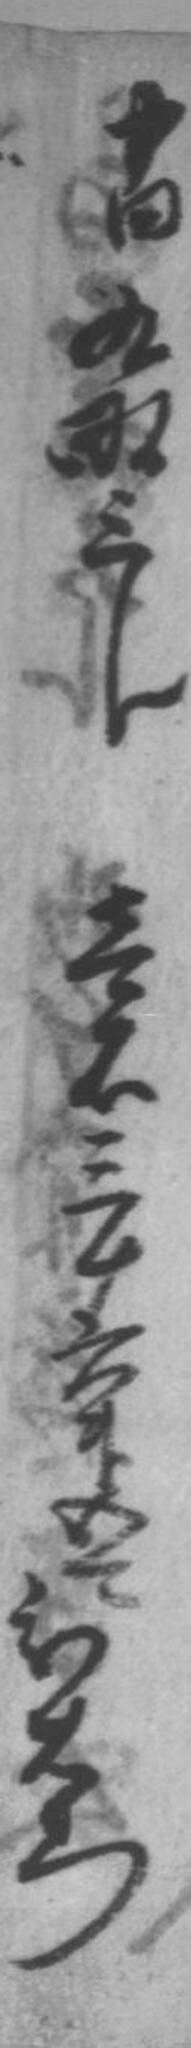中田九畝三分壱石三斗六升五合新右衛門

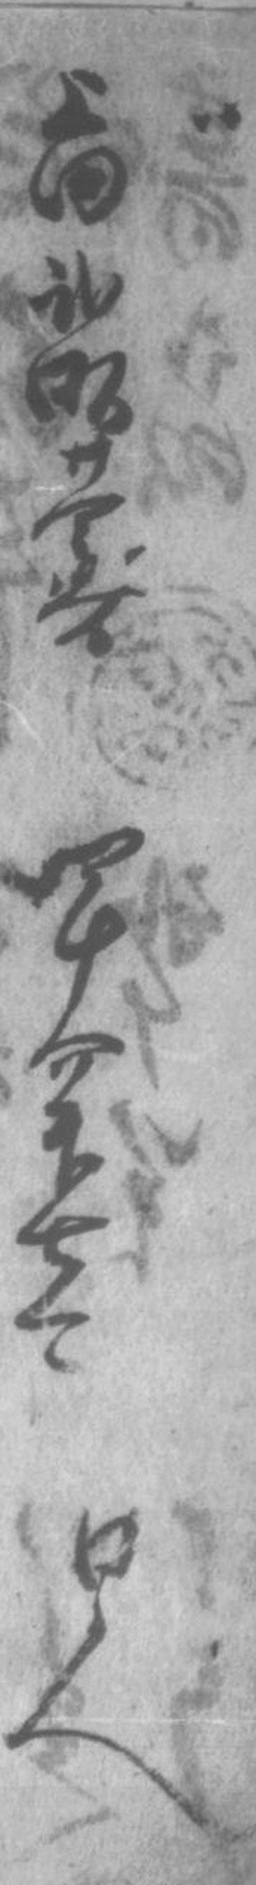上田弐畝廿四歩四斗四升七合同人
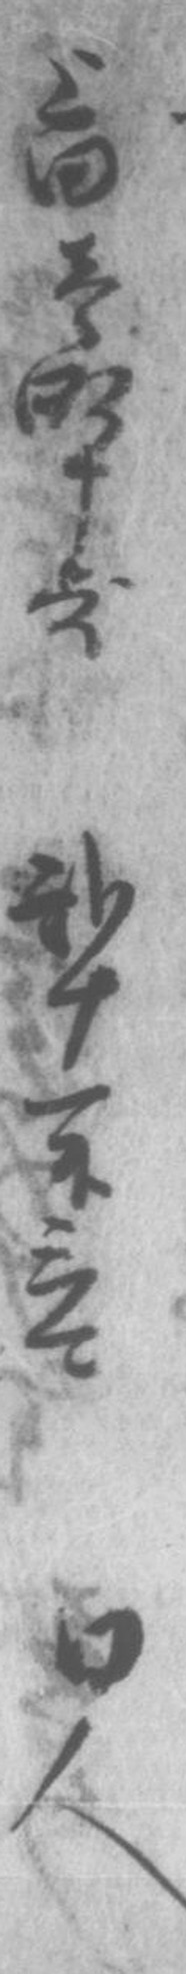上田壱畝十歩弐斗一升三合同人
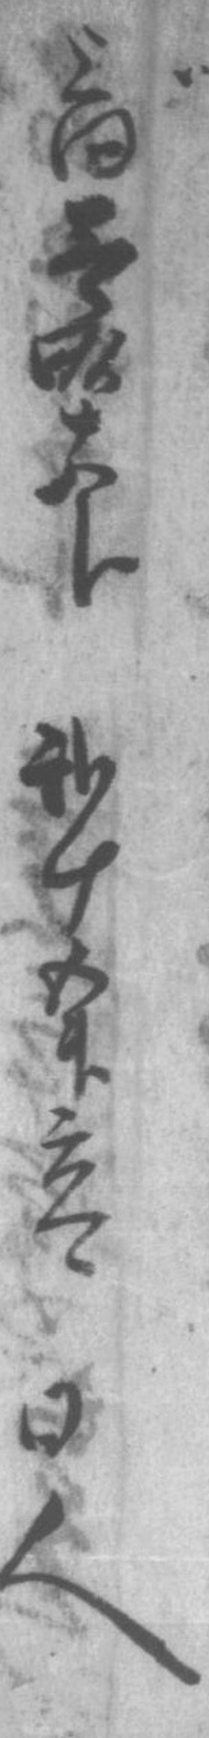上田壱畝十八分弐斗五升六合同人
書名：越州大野郡ノ内不動堂村御検地帳
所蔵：福井県文書館 Fukui Prefectural Archives
